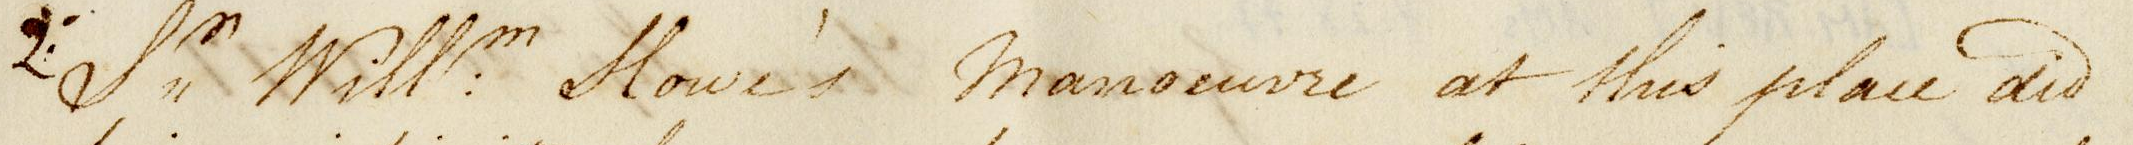S^r. Will^m: Howe's Manouvre at this place did
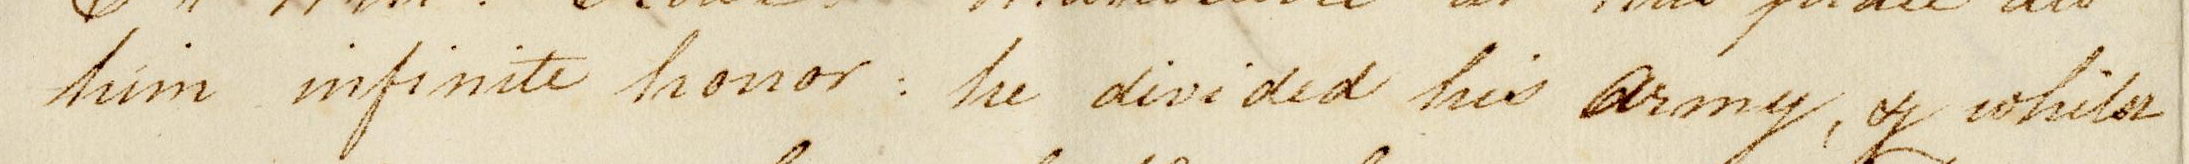him infinite honor: he divided his Army, & whilst
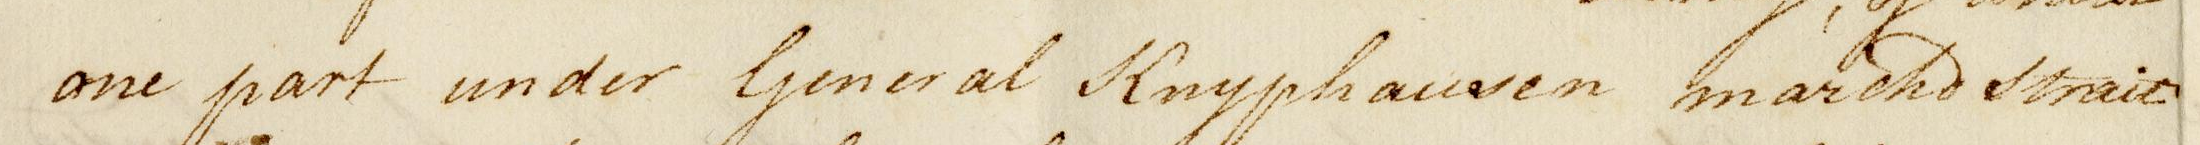one part under General Knyphausen marchd Strait
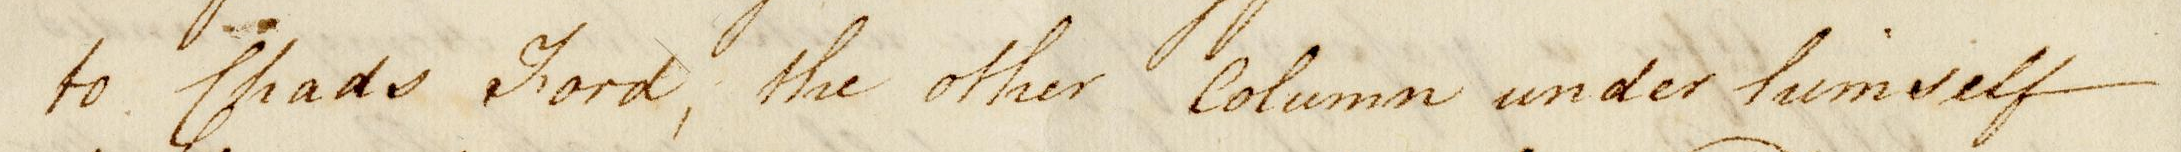to Chads Ford the other Column under himself
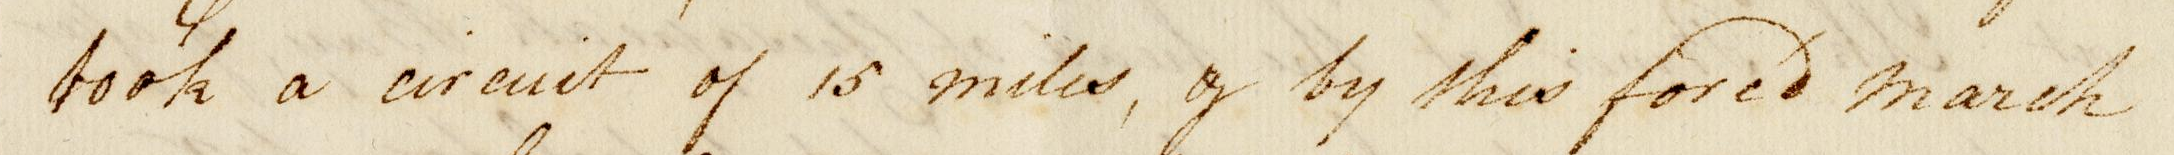took a circuit of 15 miles, & by this forc'd March
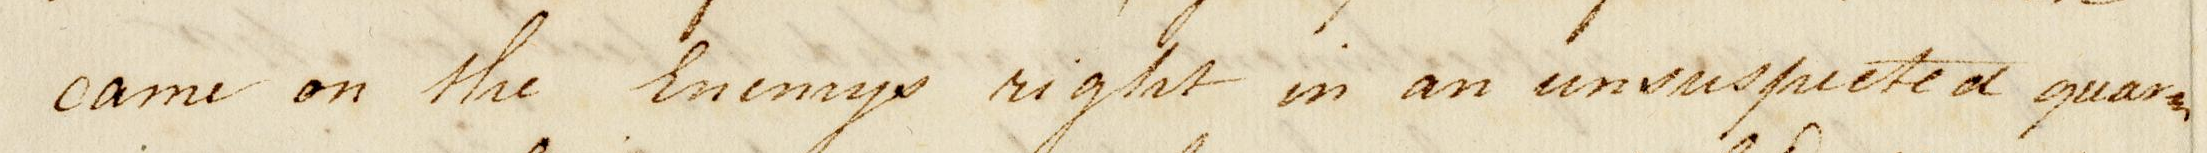came on the Enemys right in an unsuspected quar-
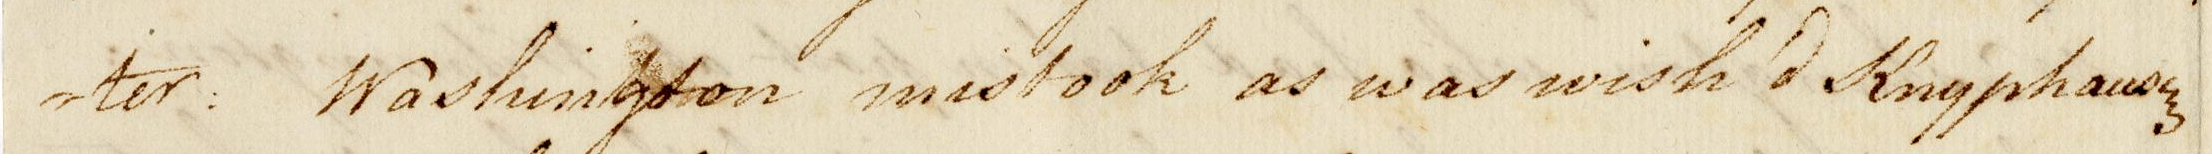-ter: Washington mistook as was wish'd Knyphausens
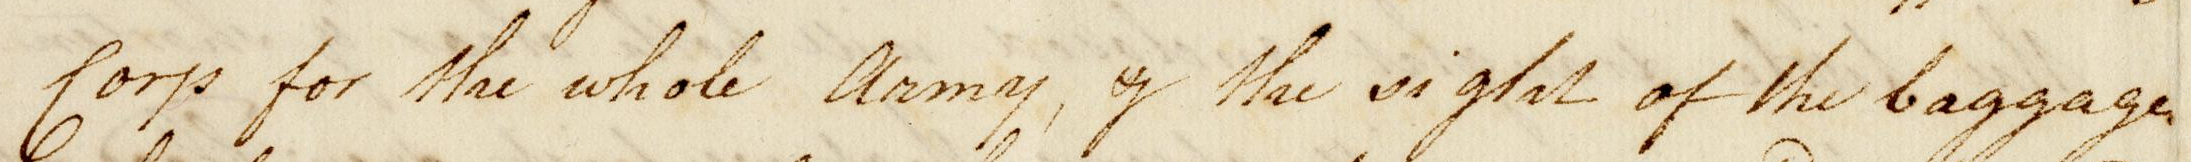Corps for the whole Army, & the sight of the baggage,
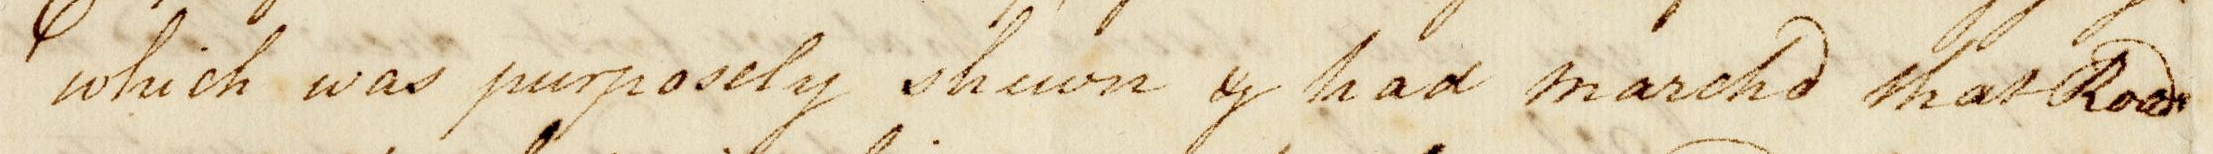which was purposely shewn & had marchd that Road
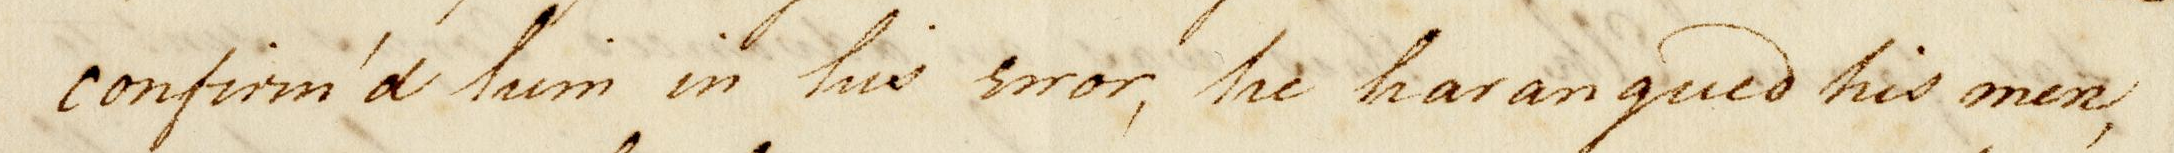confirm'd him in his Error; he harangued his men,
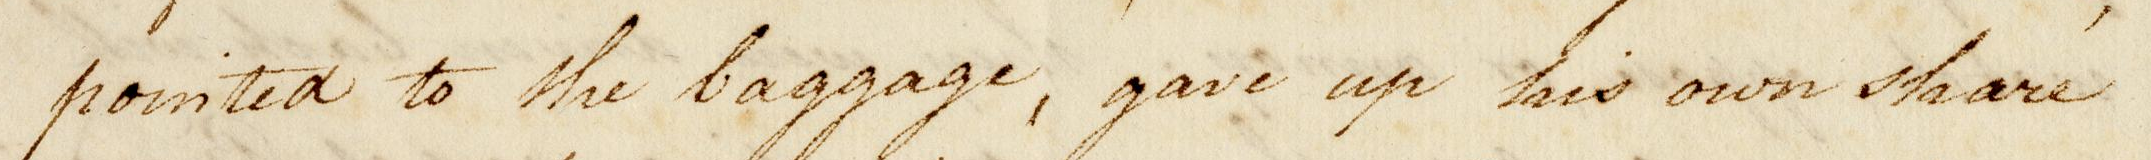pointed to the baggage, gave up his own share
